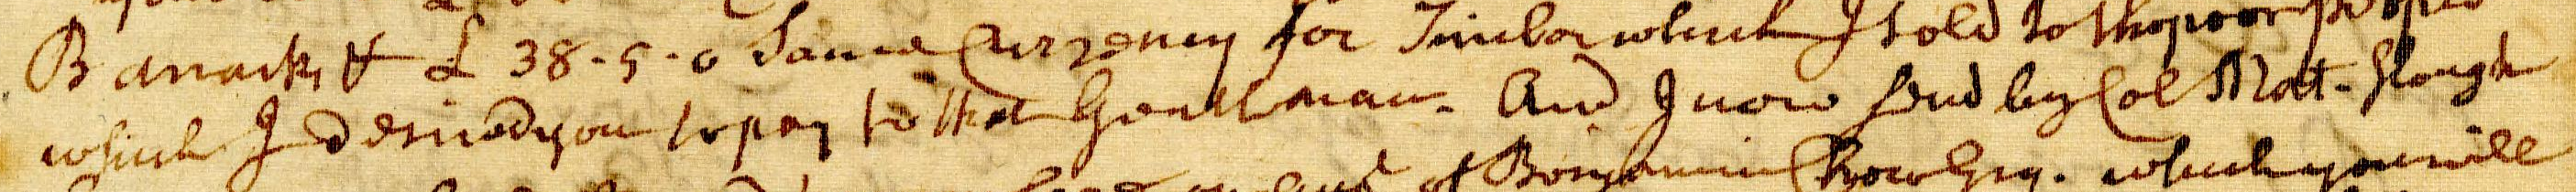which I desire you to pay to that Gentleman. And I now send by Col. Matt- Slough'
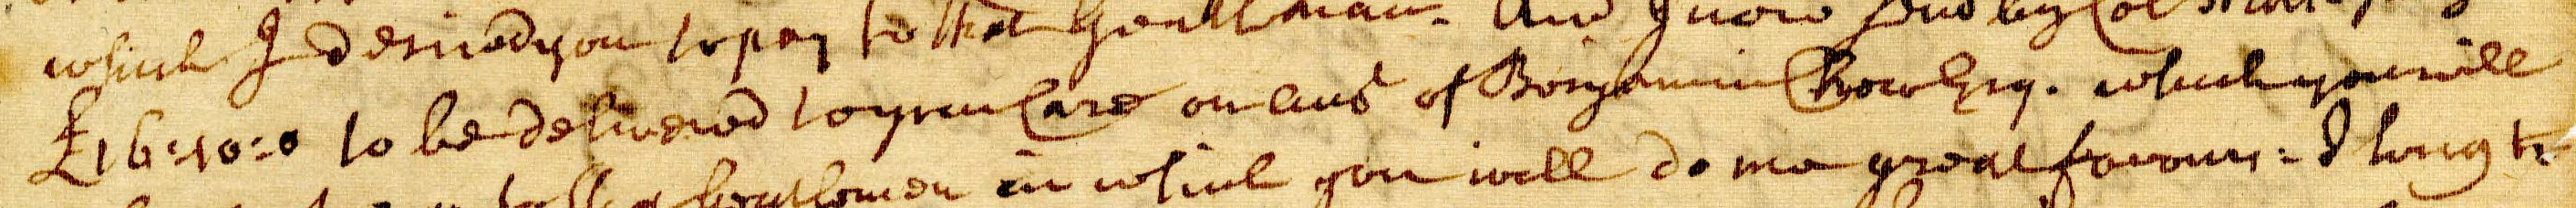£16..10..0 to be delivered to your Care on Acco^t of Benjamin Chew Esq. which you will
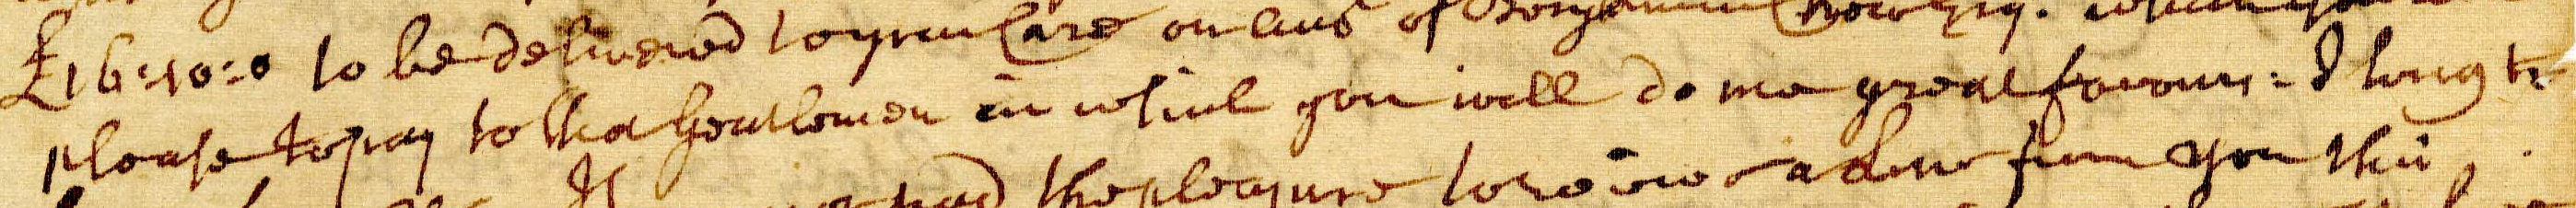please to pay to that Gentleman in which you will do me great favours: I long to
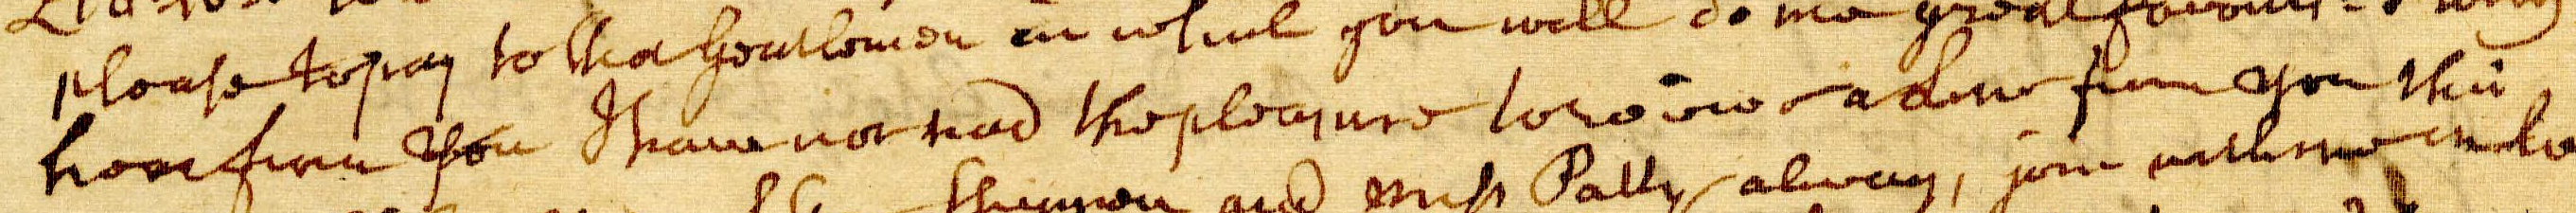hear from You I have not had the pleasure to receive a Letter from You this
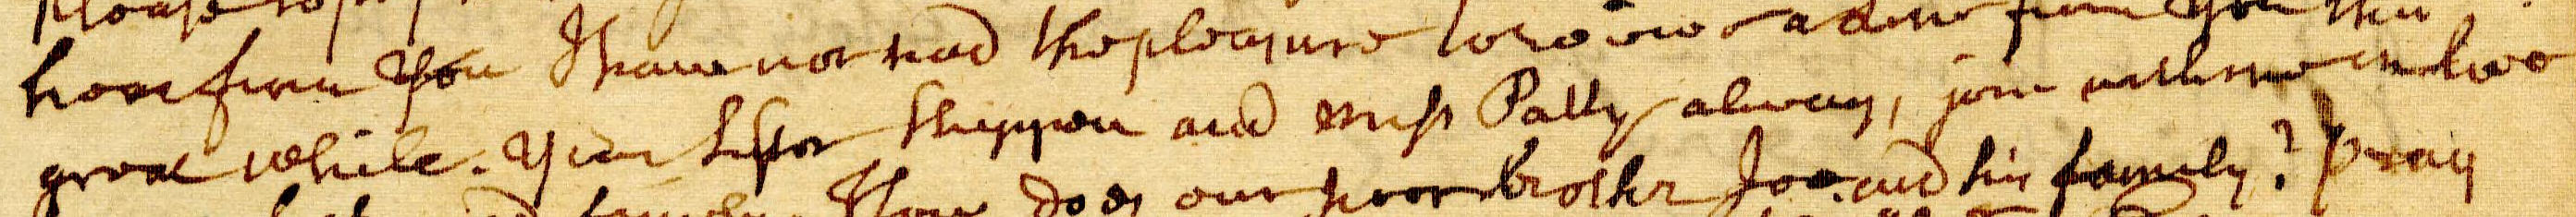great while. Your Sister Shippen and Miss Patty always join with me in love
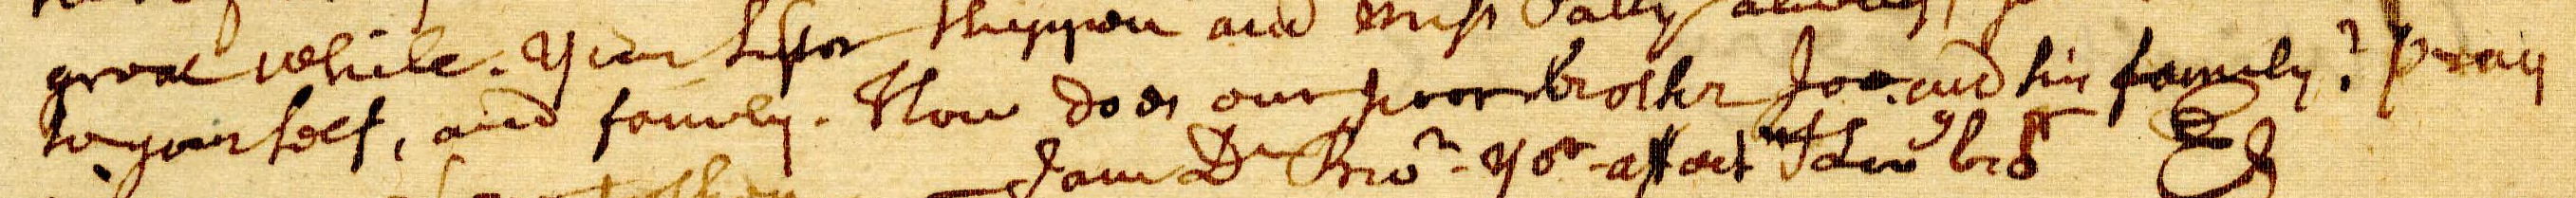to your self, and family. How does our poor brother Jos. and his family? Pray
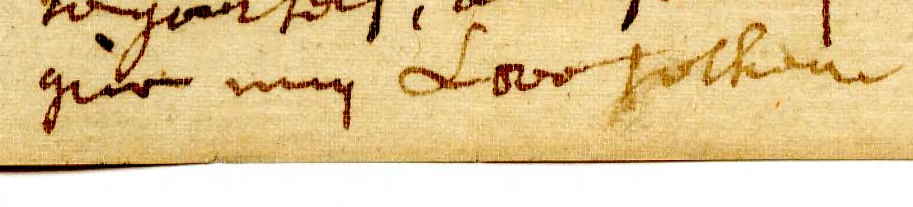give my Love to them
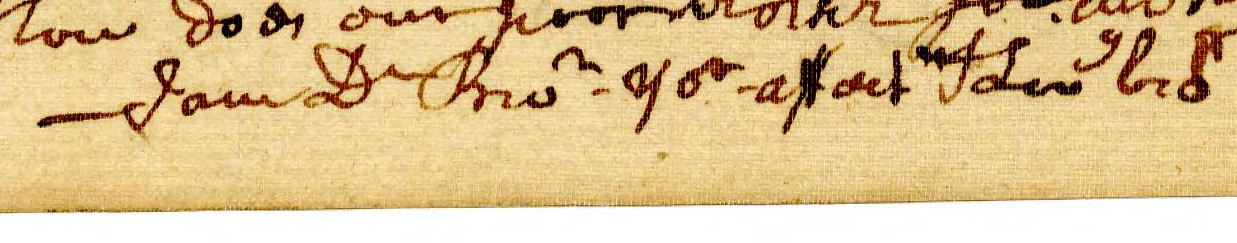- I am D^r Bro^r- Yo^r -affect^e & Lov^g bro^r
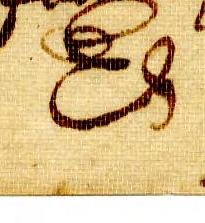ES
